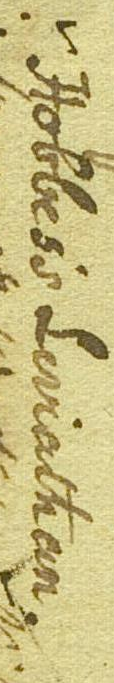- Hobbes's Leviathan.
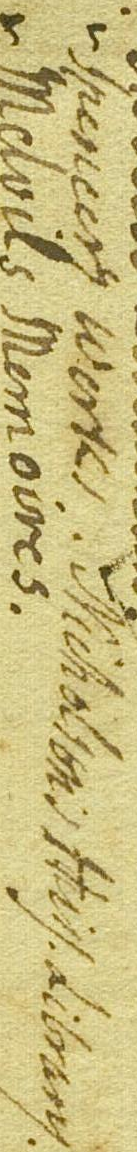- Spencers Works. Nicholson's Hist. Library.
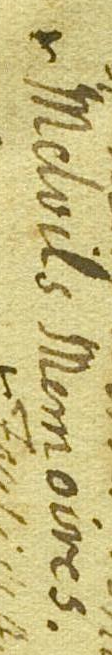- Melvils Memoires.
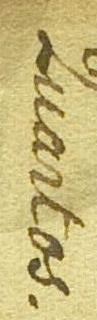Quartos.
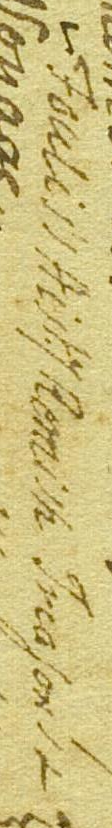- Foulis's Hist^y Romish Treasons +
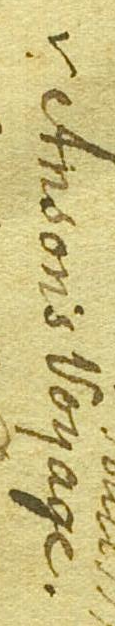- Anson's Voyage.
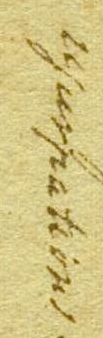usurpations
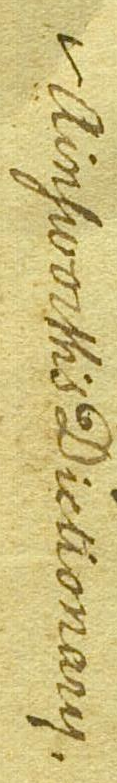- Ainsworth's Dictionary.
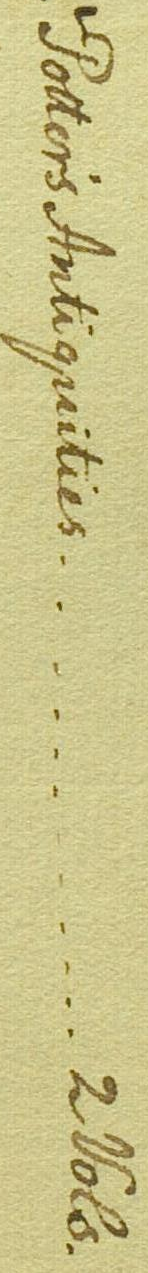- Potter's Antiquities........... 2 Vols.
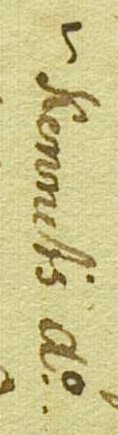- Kennet's d^o..
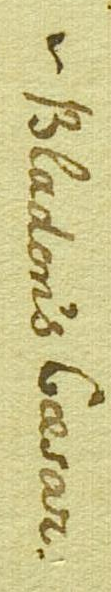- Bladen's Caesar.
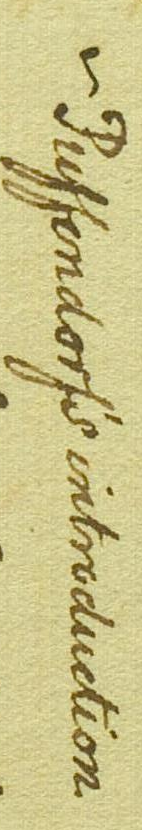- Puffendorf's introduction
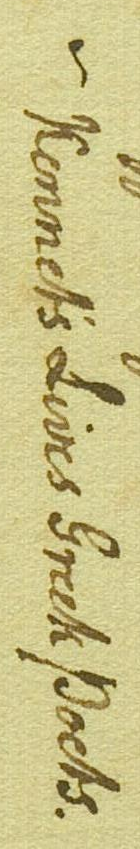- Kennet's Lives Greek Poets.
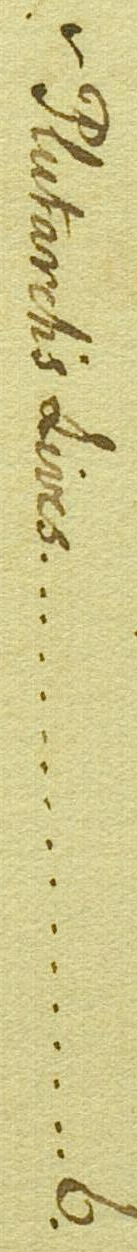- Plutarch's Lives......... 6.
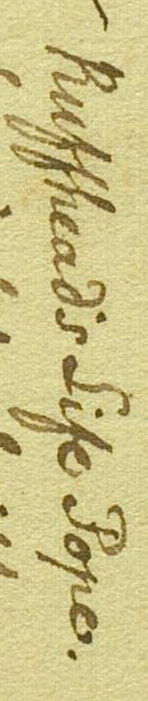- Ruffhead's Life Pope.
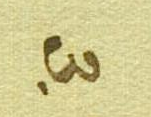3.
